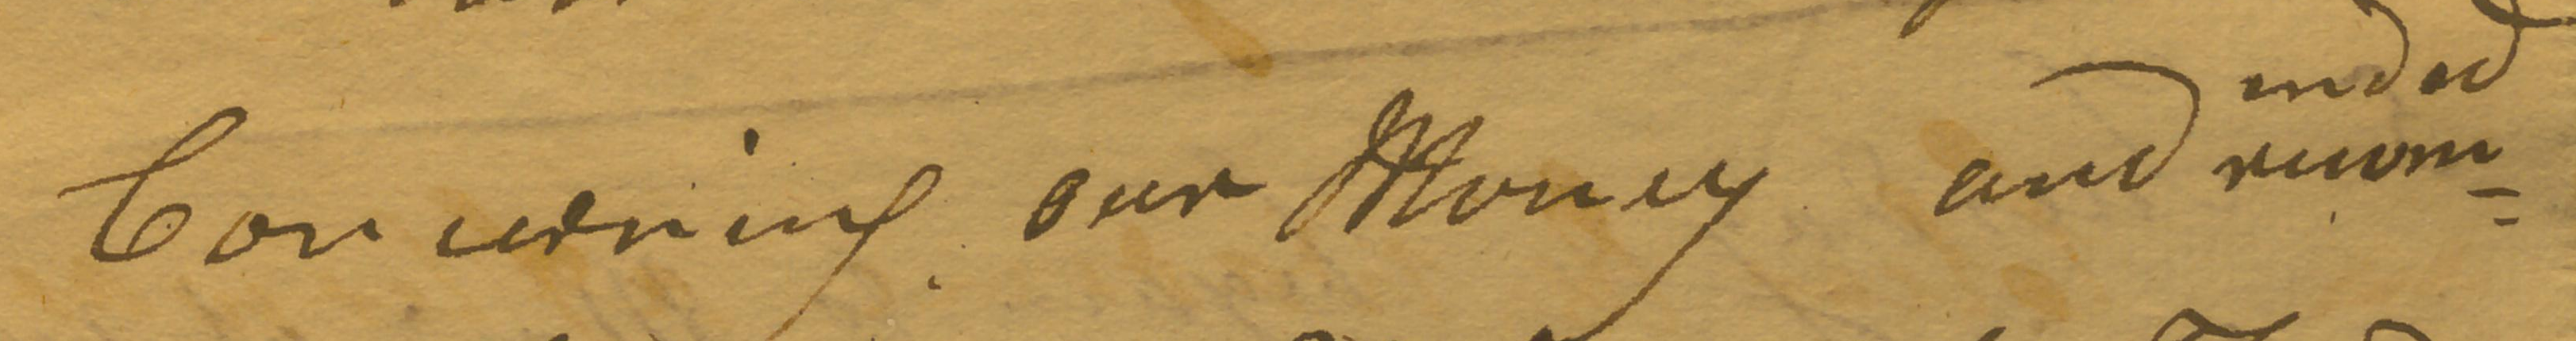Concerning our Money, and recom
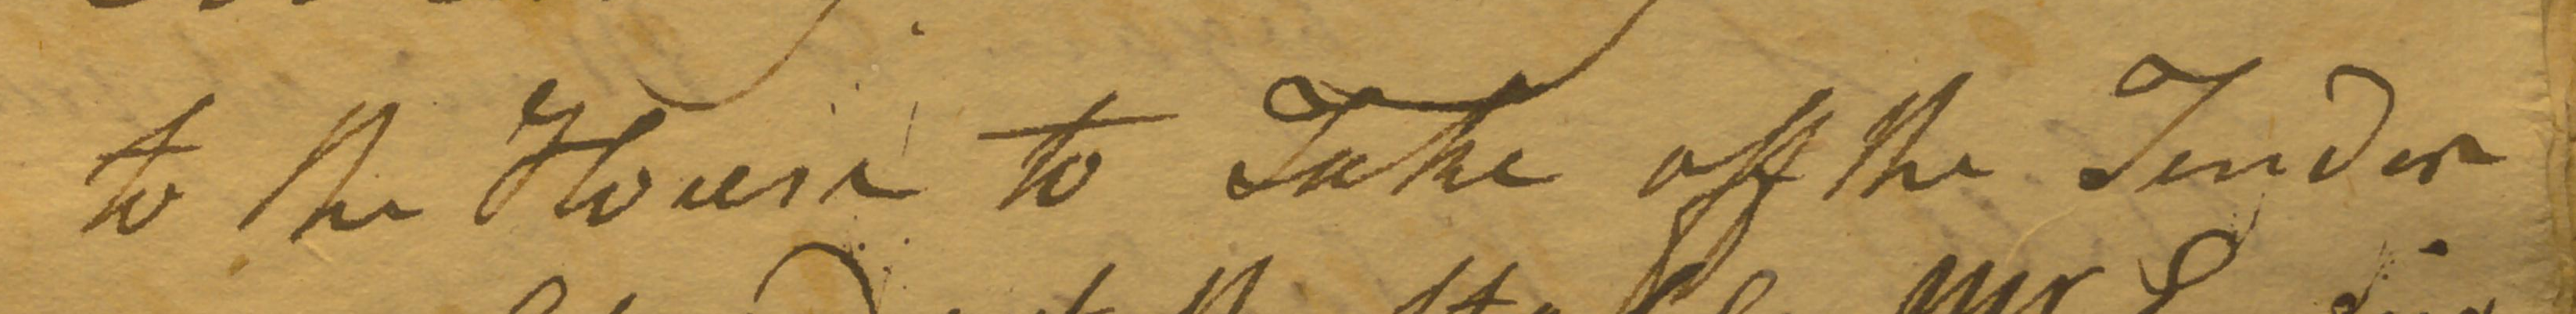to The House to Take off the Tender
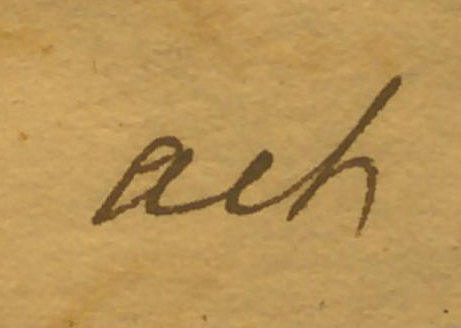act
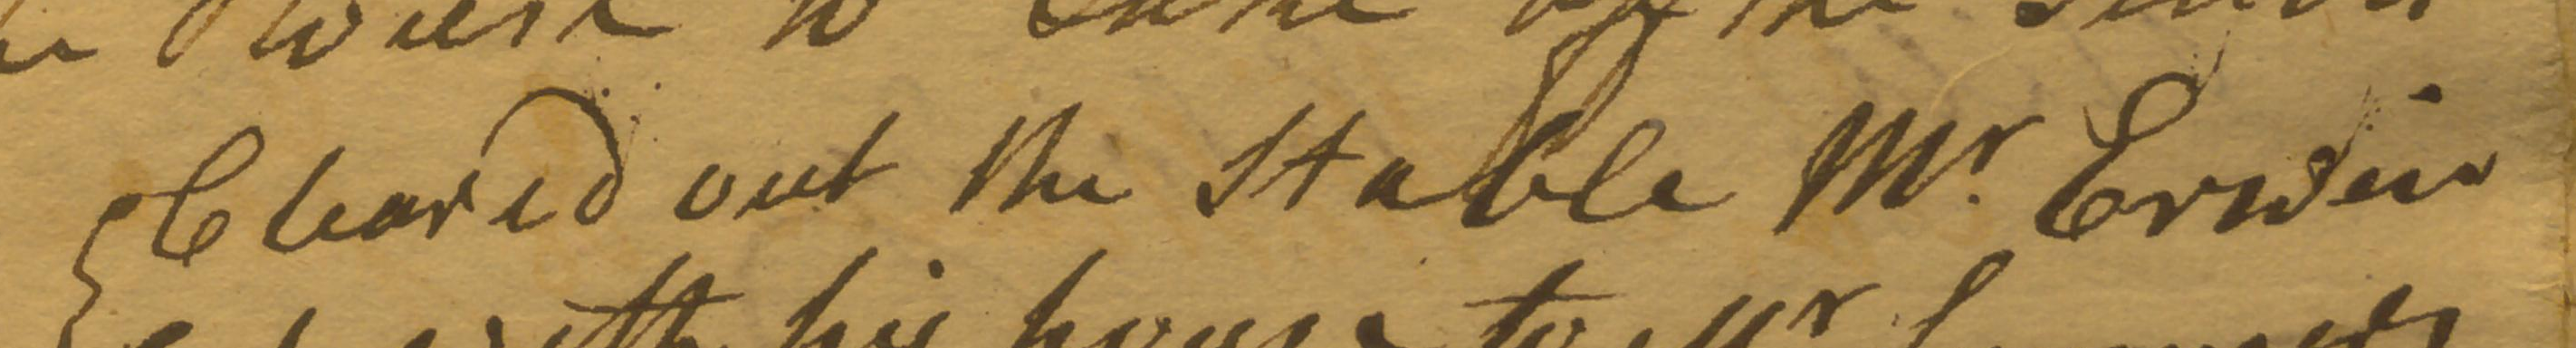Cleared out the Stable M^r. Crwen
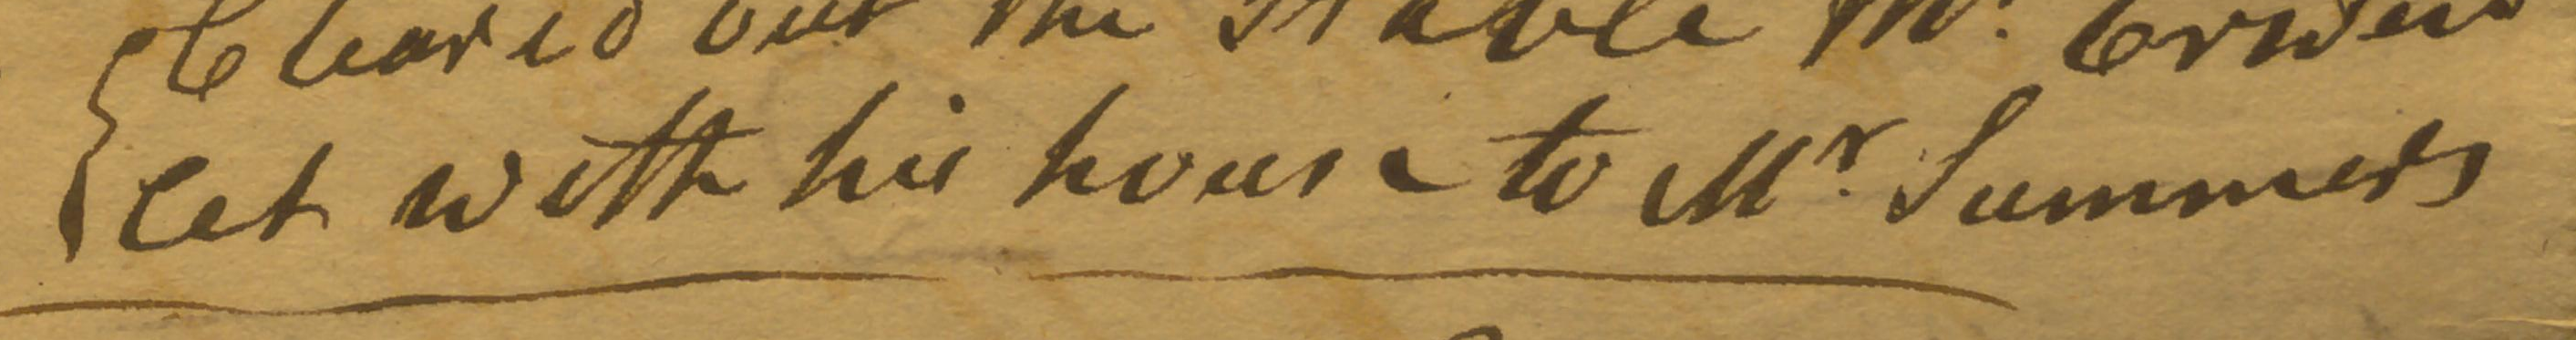let with his house to M^r. Summers
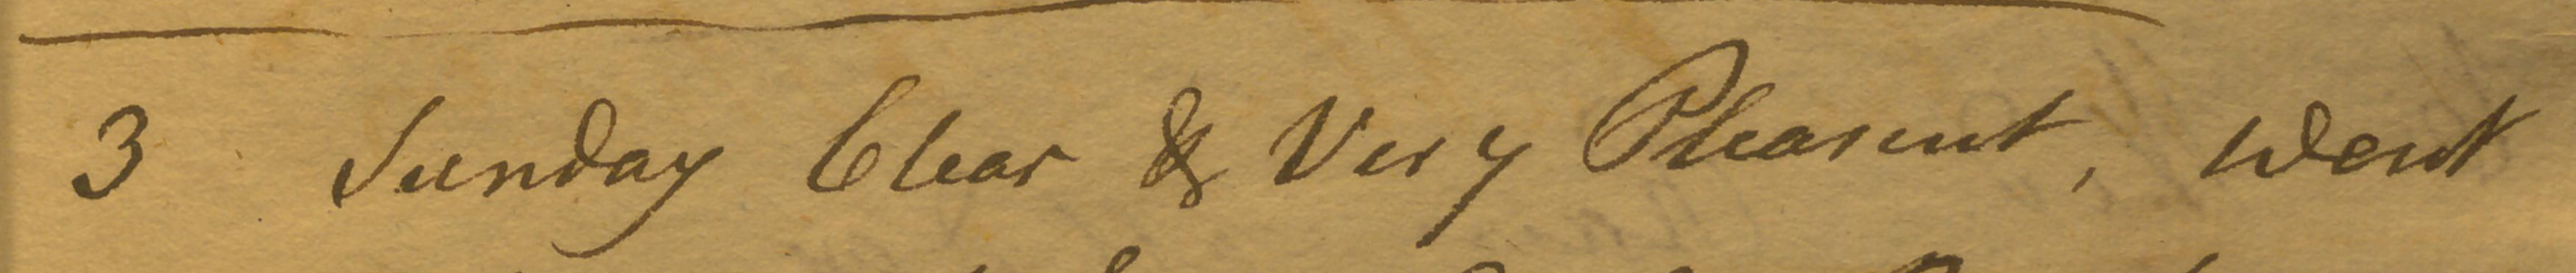3 Sunday Clear & Very Pleasent. went
